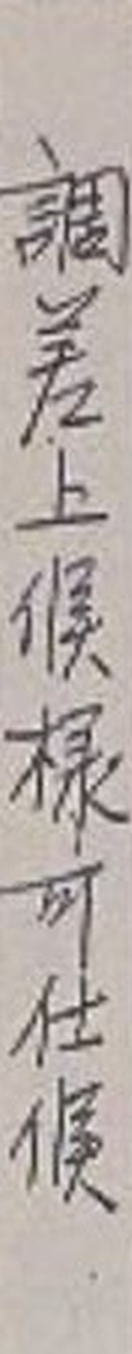調差上候様可仕候
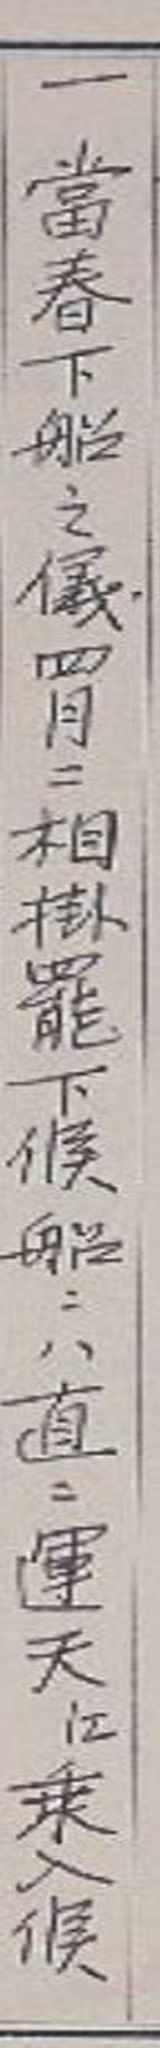一当春下船之儀四月に相掛罷下候船には直に運天え乗入候
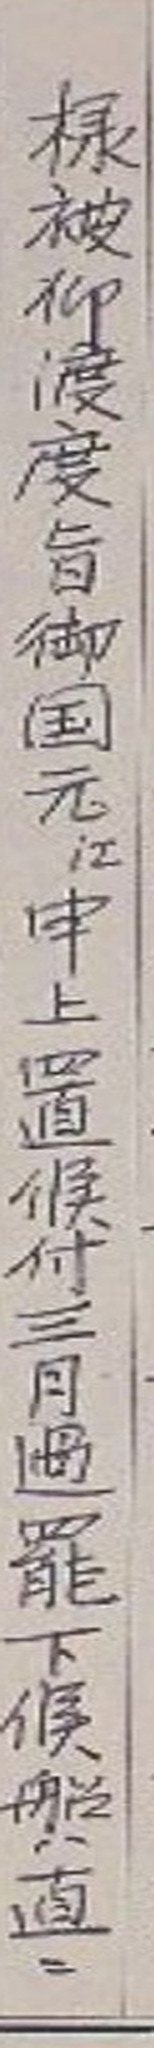様被仰渡度旨御国元え申上置候付三月過罷下候船は直に
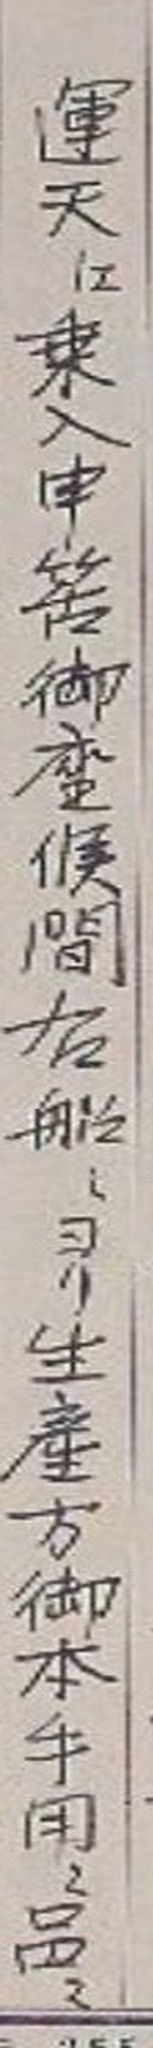運天え乗入申筈御座候間右船々より生産方御本手用々品々
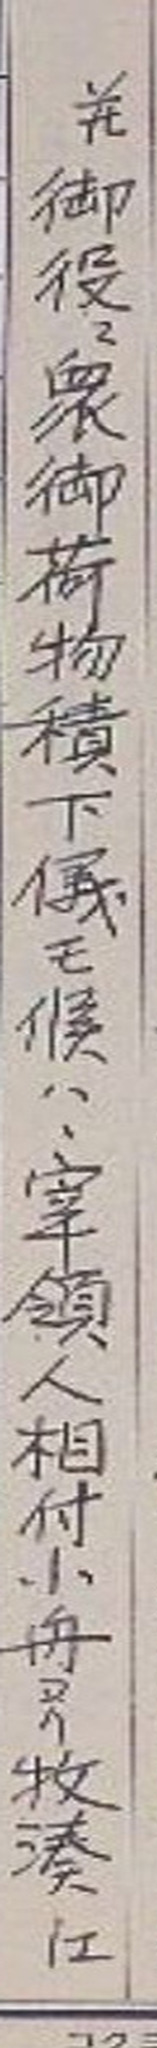并御役々衆御荷物積下儀も候はゝ宰領人相付小舟より牧湊え
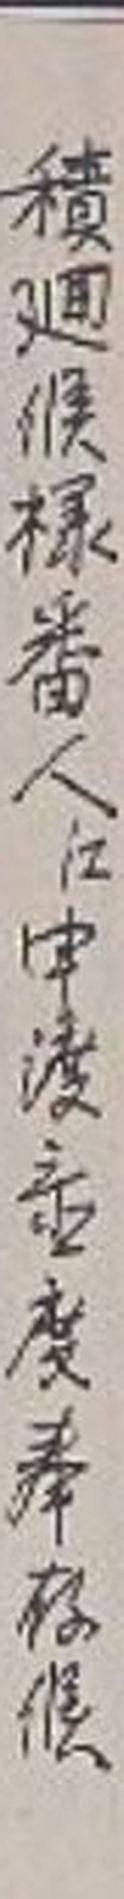積廻候様番人え申渡置度奉存候
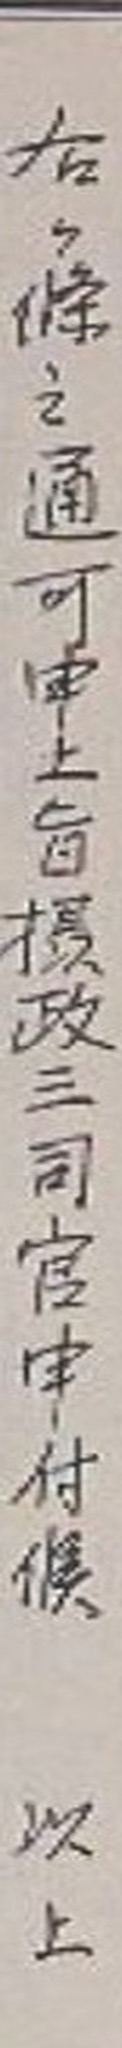右ヶ条之通可申上旨摂政三司官申付候以上
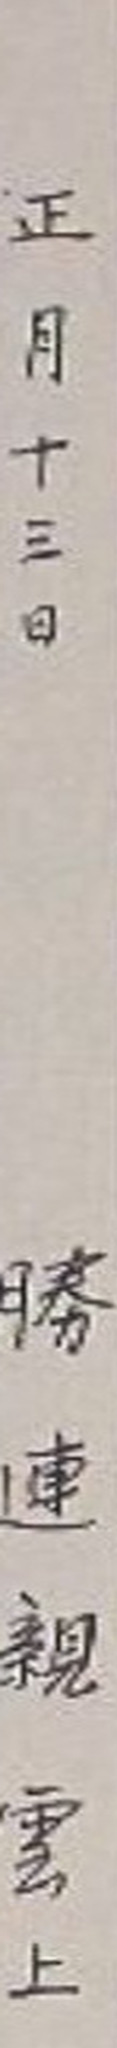正月十三日勝連親雲上
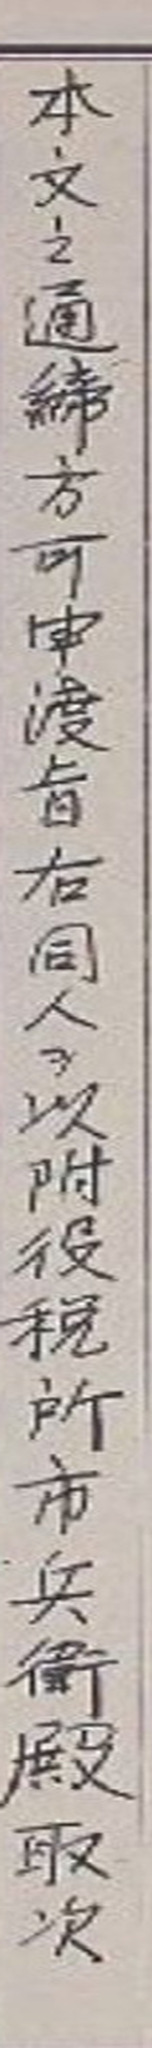本文之通締方可申渡旨右同人を以附役税所市兵衛殿取次
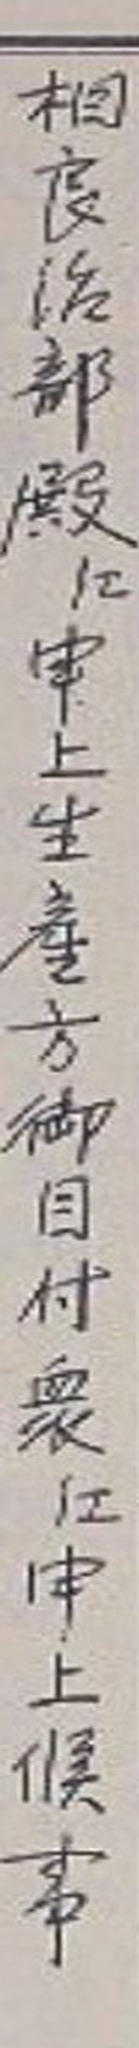相良治部殿え申上生産方御目付衆え申上候事
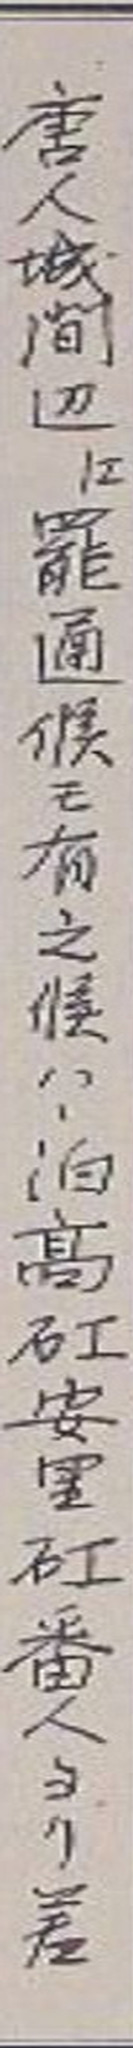唐人城間辺え罷通候も有之候はゝ泊高矼安里矼番人より差
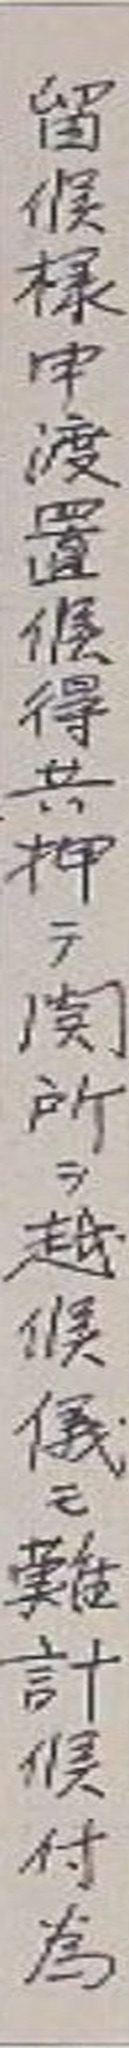留候様申渡置候得共押て関所を越候儀も難計候付為
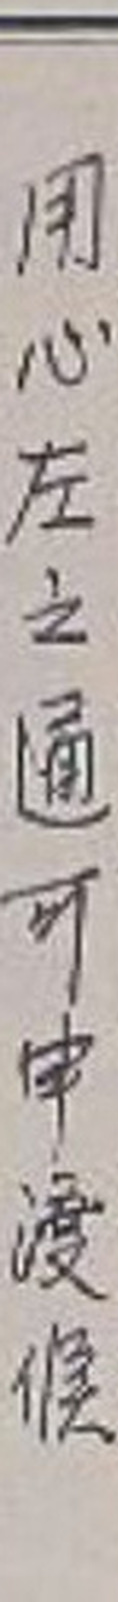用心左之通可申渡候
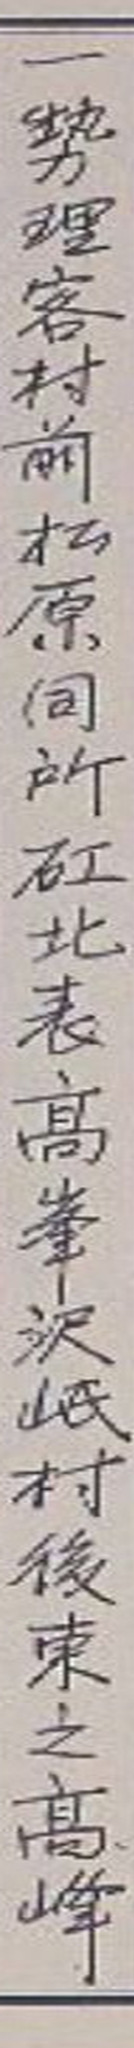一勢理客村前松原同所矼北表高峯沢岻村後東之高峰
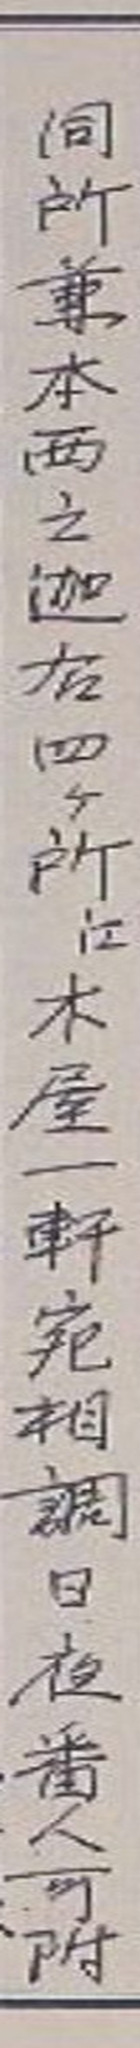同所兼本西之迦右四ヶ所え木屋一軒宛相調日夜番人可附置候
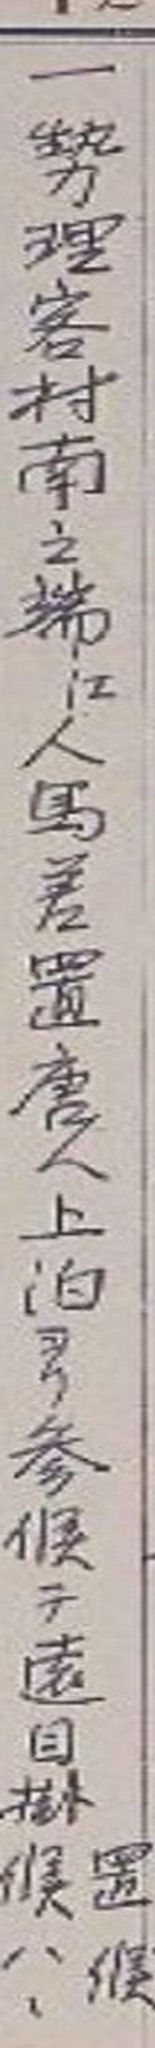一勢理客村南之端え人馬差置唐人上泊より参候て遠目掛候はゝ
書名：支那冊封使来琉諸記 下巻
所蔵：University of the Ryukyus Library
